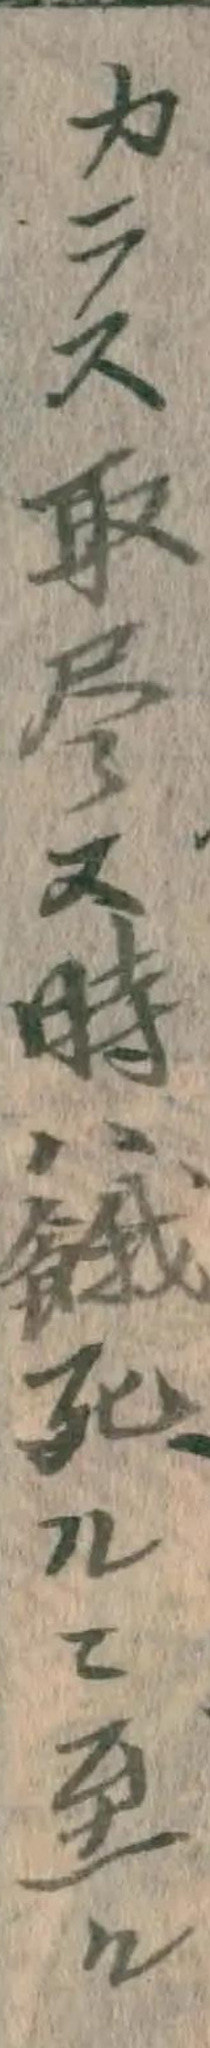カラス取尽ス時ハ餓死ルニ至ル
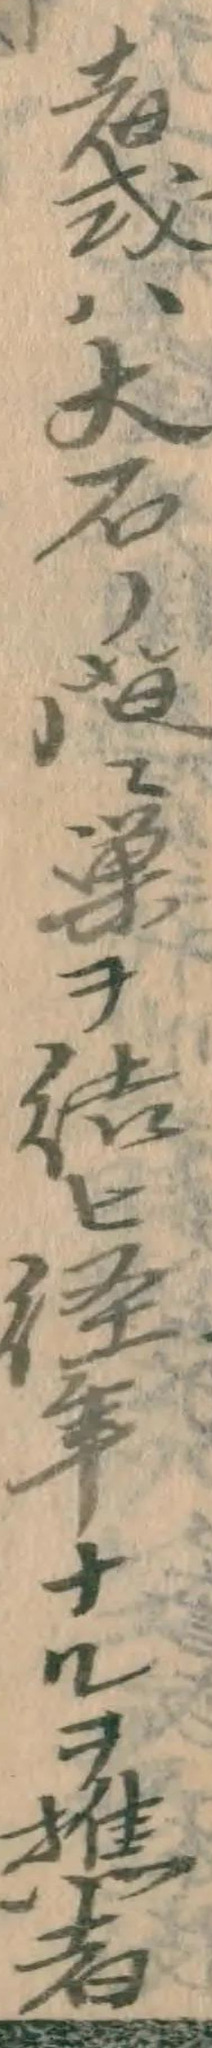者或ハ大石ノ間ニ巣ヲ結ヒ経年ナルヲ樵者
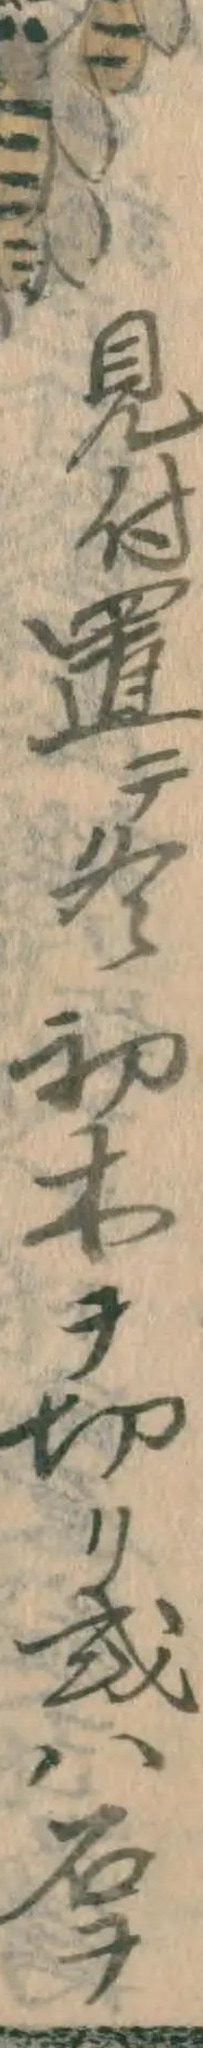見付置テ冬初木ヲ切リ或ハ石ヲ
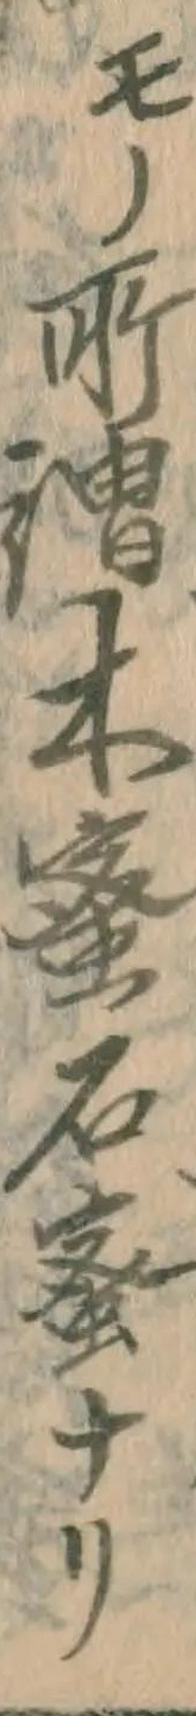モノ所謂木蜜石蜜ナリ
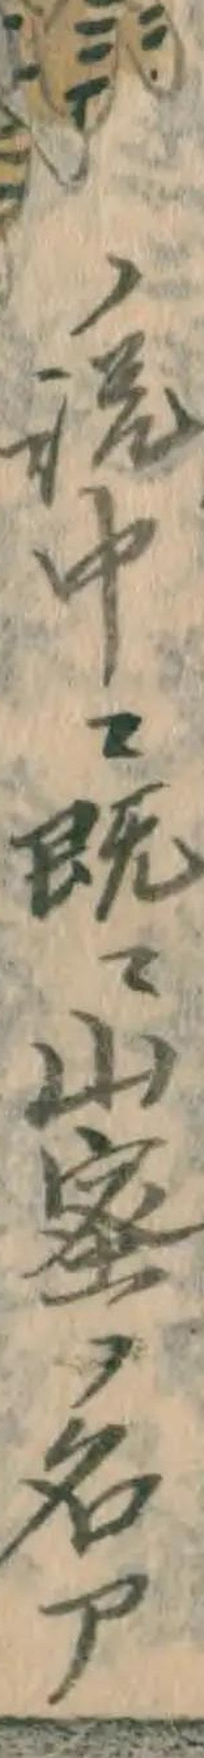ノ説中ニ既ニ山蜜ノ名ア
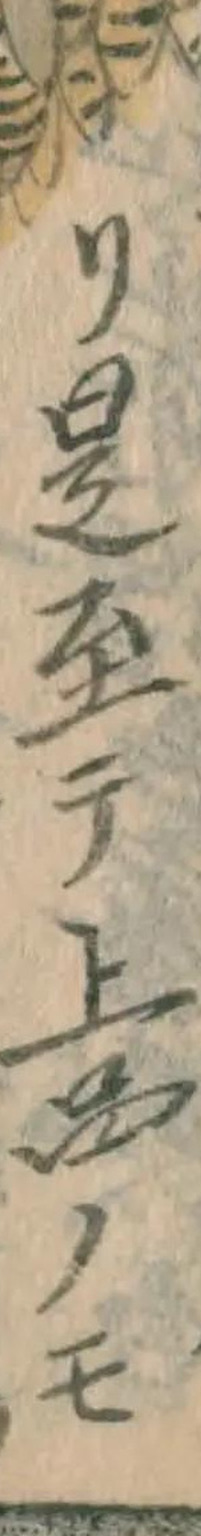リ是至テ上品ノモノ
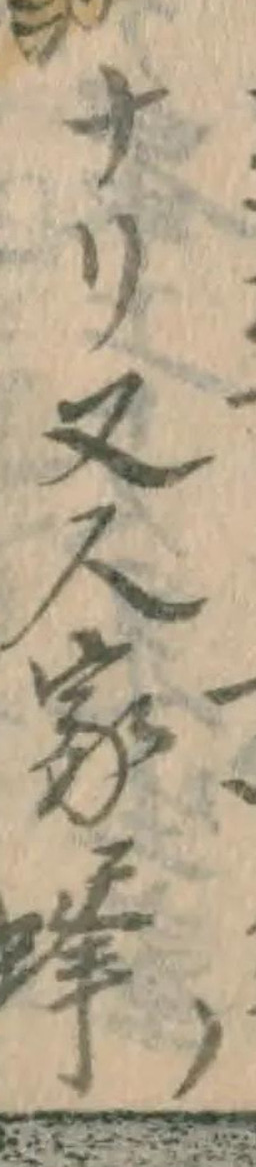ナリ又人家蜂
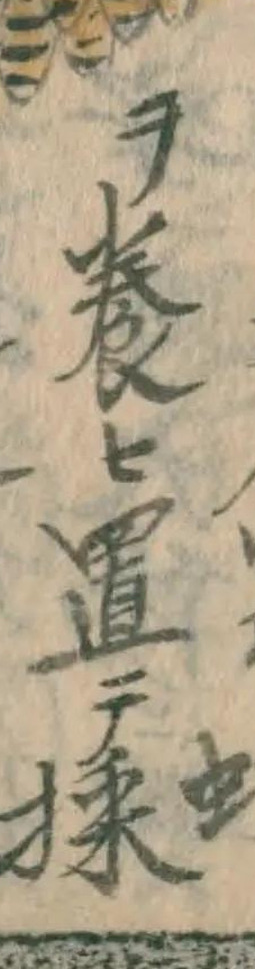ヲ養ヒ置テ採
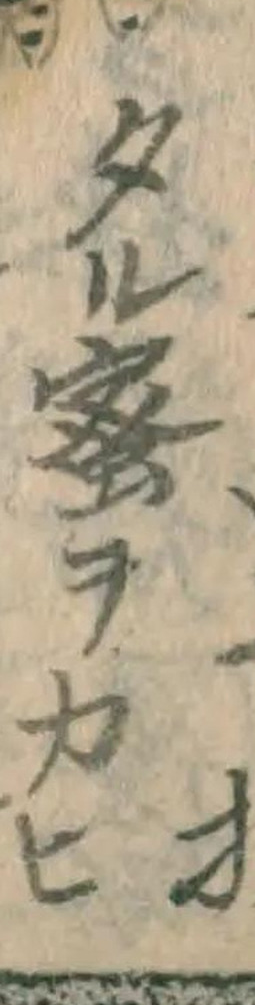タル蜜ヲカヒ
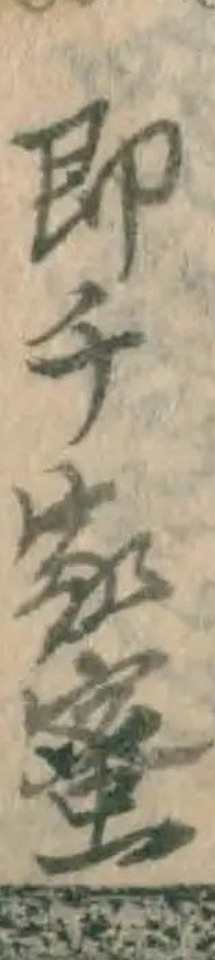即チ家蜜
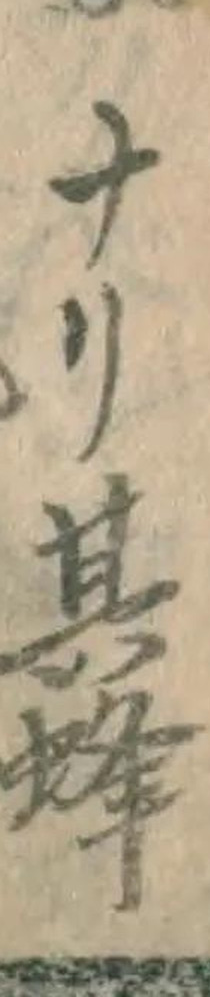ナリ其蜂
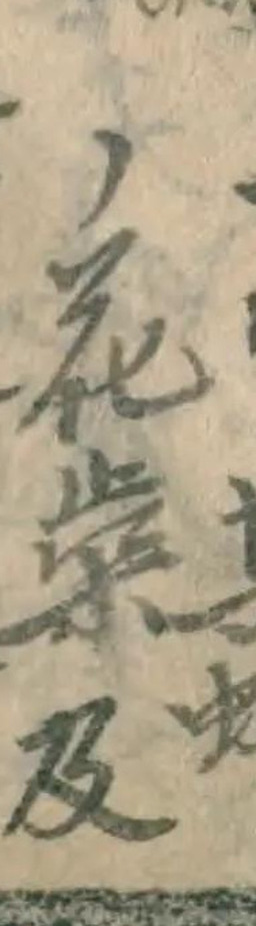ノ花蘂及
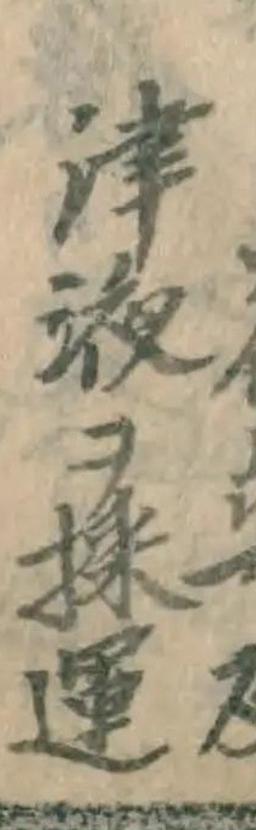津液ヲ採運

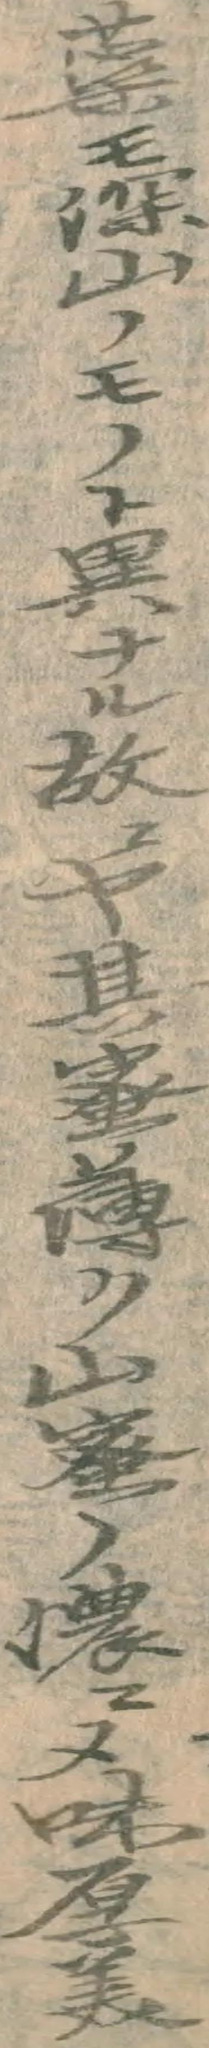蘂モ深山ノモノト異ナル故ニヤ其蜜薄ク山蜜ノ濃ニシテ味厚美
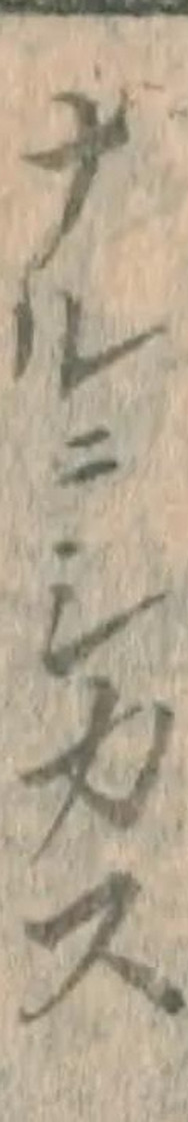ナルニシカス
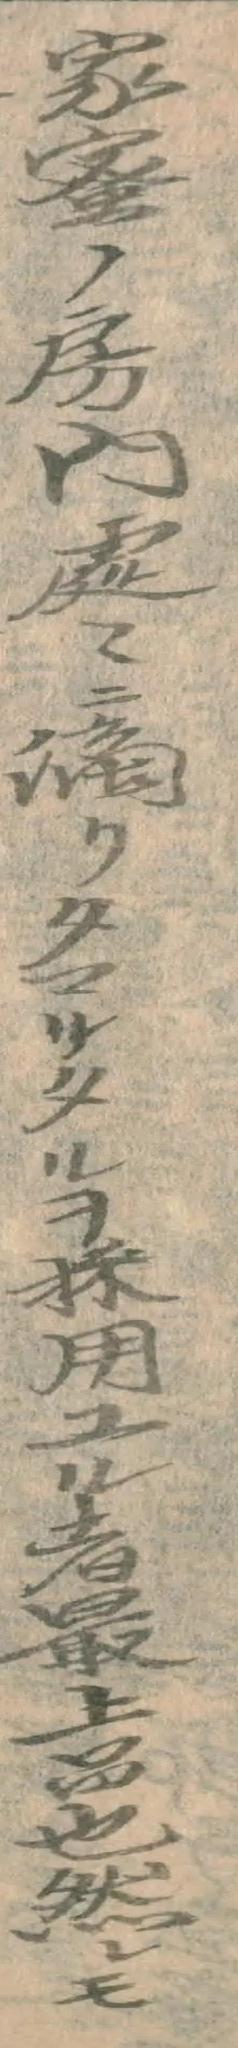家蜜ノ房内處々ニ滴リタマリタルヲ採用ユル者最上品ナリ然レモ
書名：千蟲譜 3巻. [1]
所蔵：国立国会図書館 National Diet Library, JAPAN
